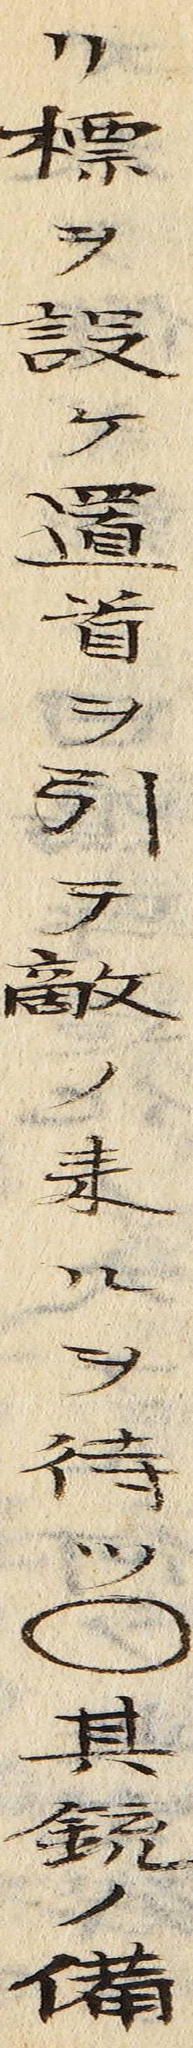リ標ヲ設ケ置首ヲ引テ敵ノ来ルヲ待ツ◯其銃ノ備
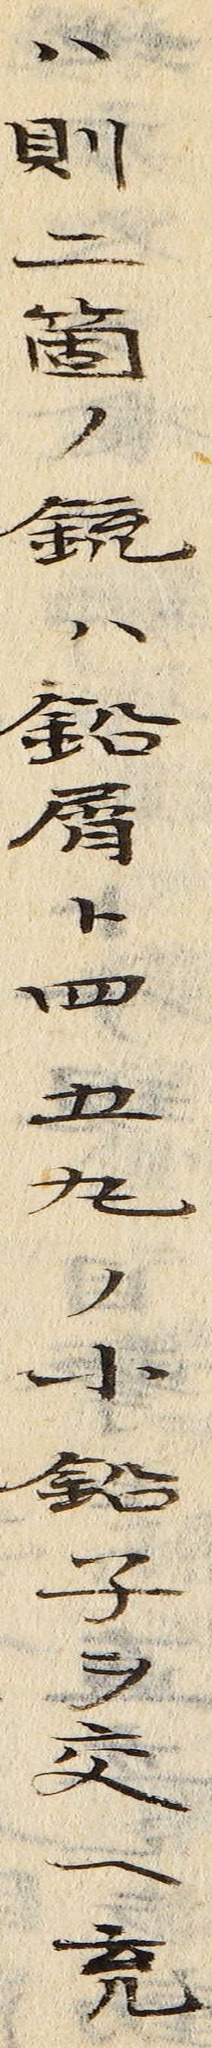ハ則二箇ノ銃ハ鉛屑ト四五丸ノ小鉛子ヲ交ヘ充
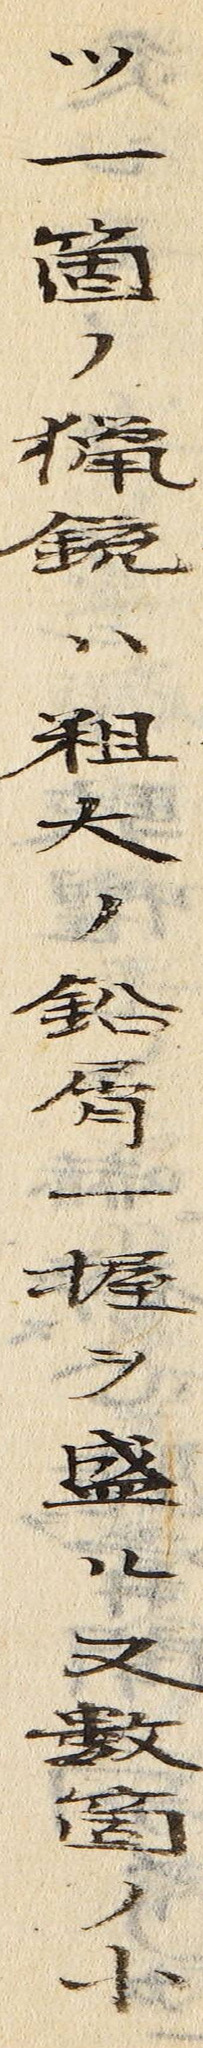ツ一箇ノ猟銃ハ粗大ノ鉛屑一握ヲ盛ル又数箇ノ小
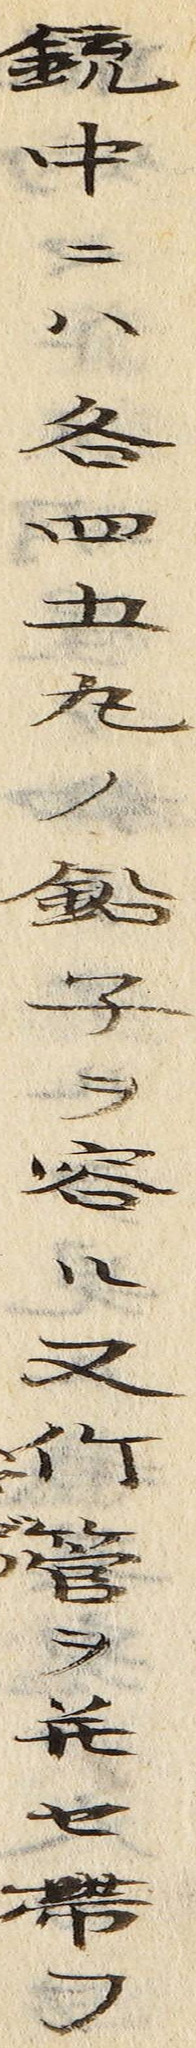銃中ニハ各四五丸ノ鉛子ヲ容ル又竹管ヲ并セ帯フ
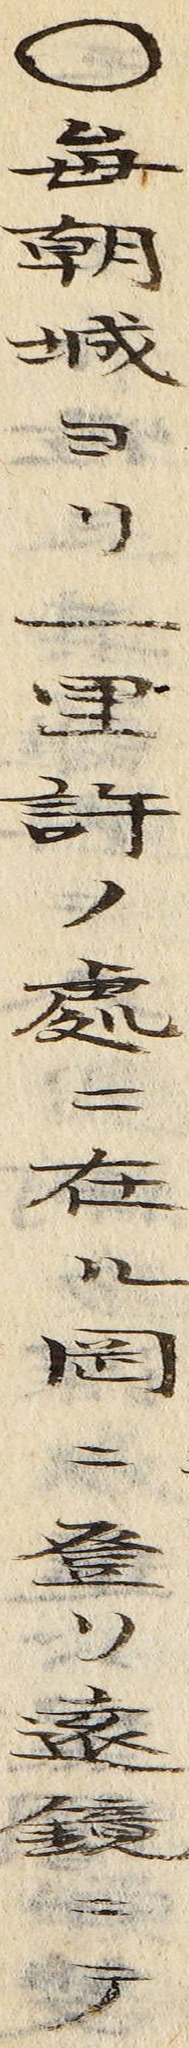◯毎朝城ヨリ一里許ノ処ニ在ル岡ニ登リ遠鏡ニテ
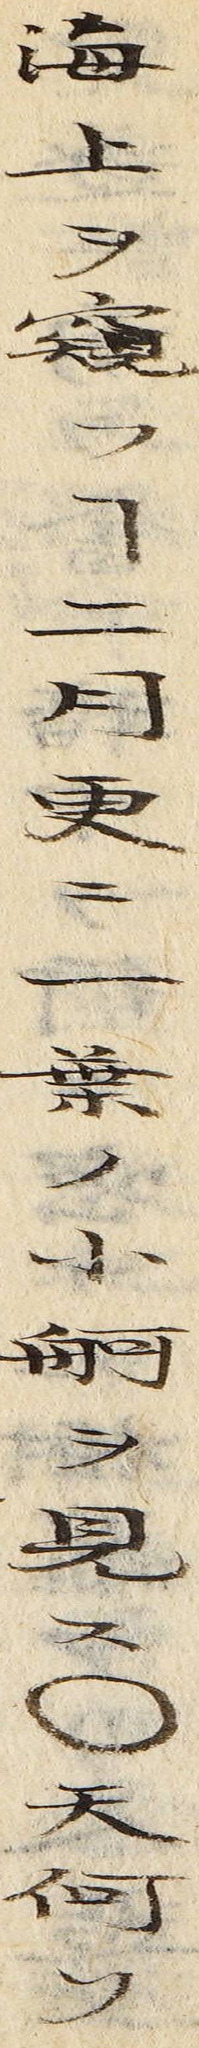海上ヲ窺フコト二月更ニ一葉ノ小舸ヲ見ス◯天何ソ
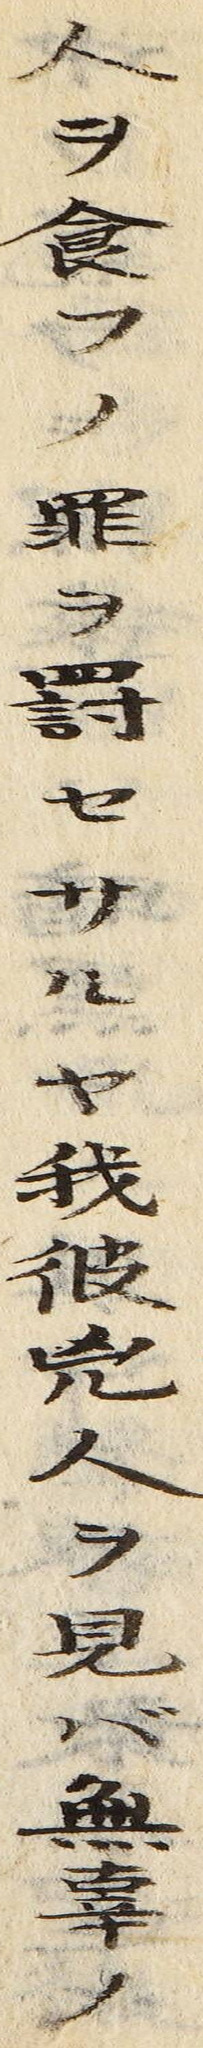人ヲ食フノ罪ヲ罰セサルヤ我彼兇人ヲ見バ無辜ノ
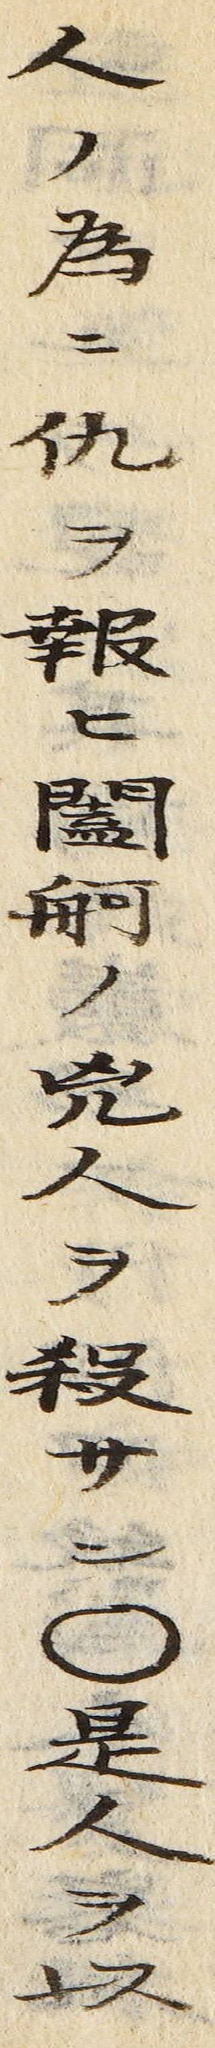人ノ為ニ仇ヲ報ヒ闔舸ノ兇人ヲ殺サン◯是人ヲ以
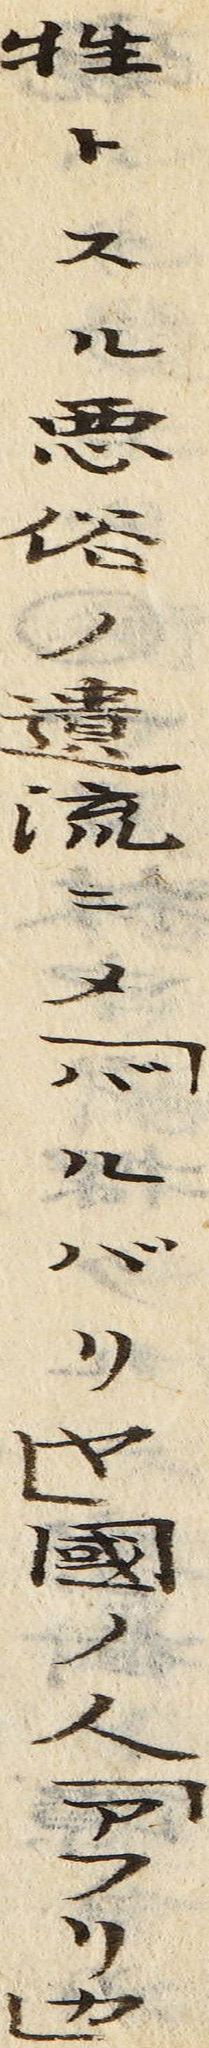牲トスル悪俗ノ遺流ニシテ「バルバリヤ」国ノ人「アフリカ」
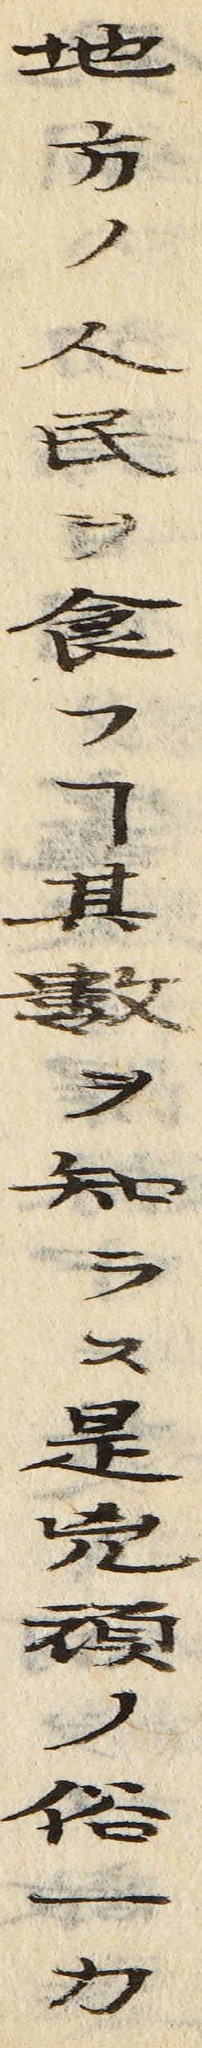地方ノ人民ヲ食フコト其数ヲ知ラス是兇頑ノ俗一力
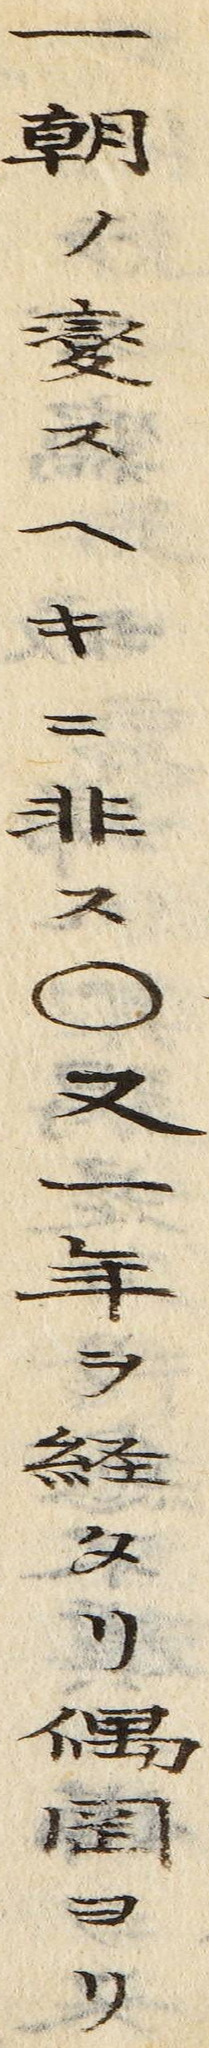一朝ノ変スヘキニ非ス◯又一年ヲ経タリ偶岡ヨリ
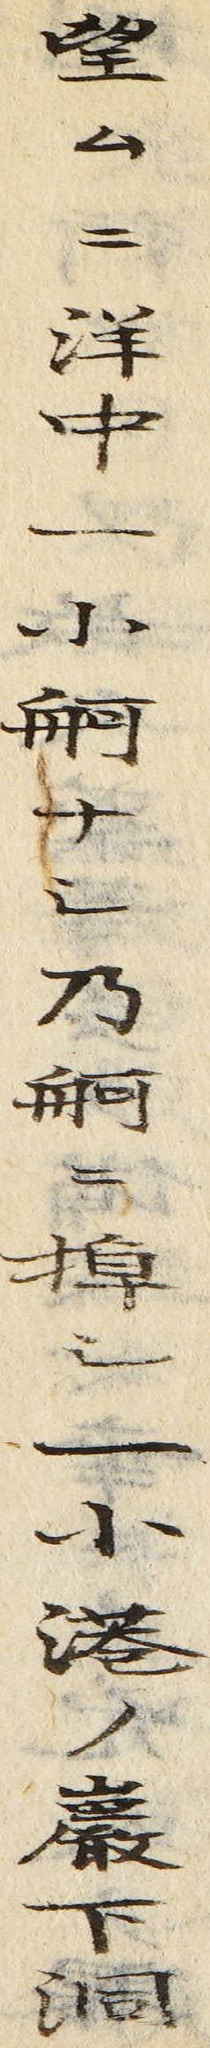望ムニ洋中一小舸ナシ乃舸ニ掉シ一小港ノ巌下洞
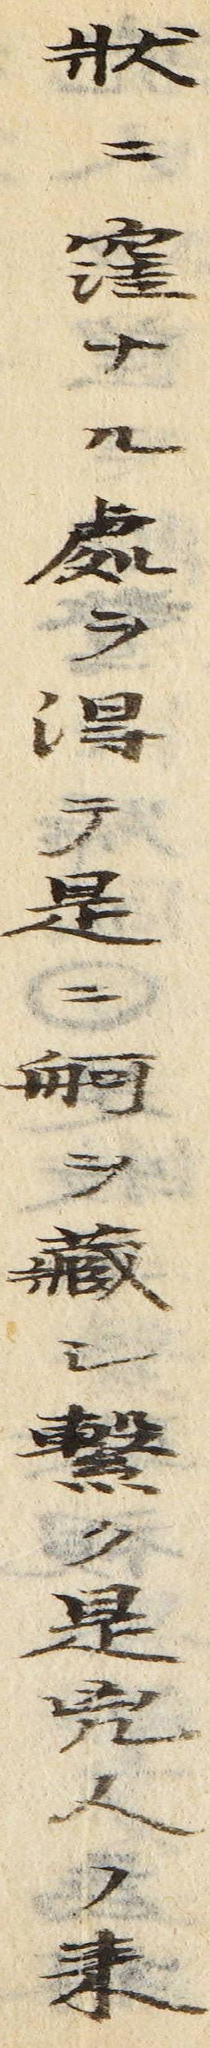状ニ窪ナル処ヲ得テ是ニ舸ヲ蔵シ繋ク是兇人ノ来
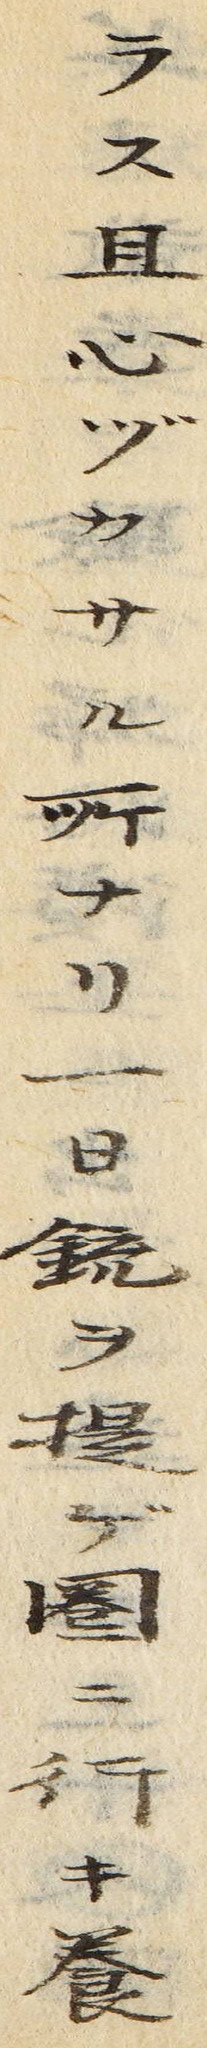ラス且心ヅカサル所ナリ一日銃ヲ提ゲ圏ニ行キ養

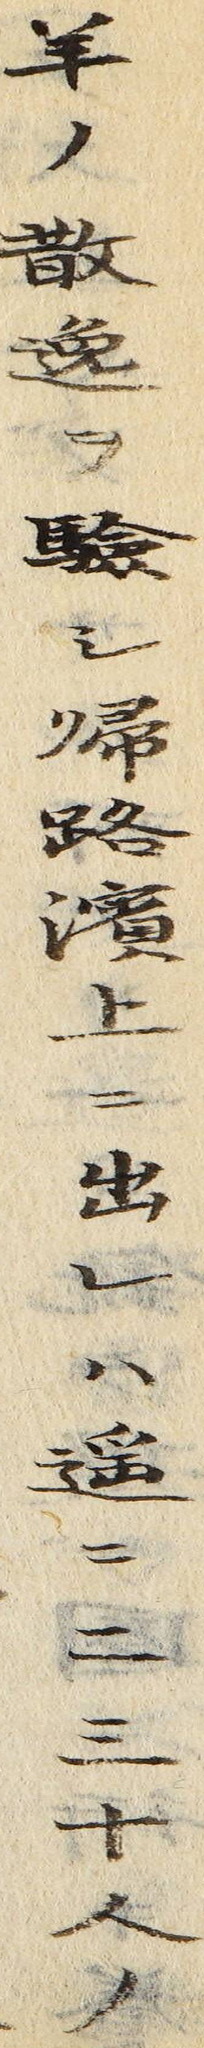羊ノ散逸ヲ験シ帰路浜上ニ出レハ遥ニ二三十ノ
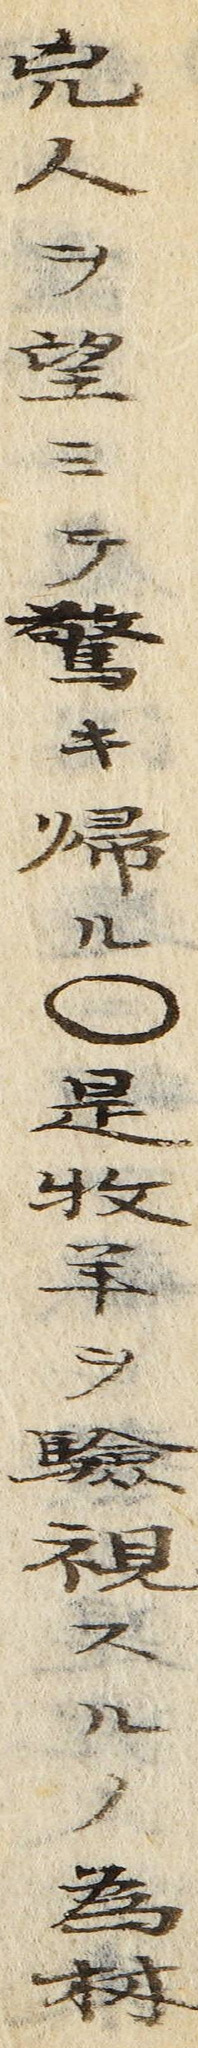兇人ヲ望ミテ驚キ帰ル◯是牧羊ヲ験視スルノ為林
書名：漂流紀事
